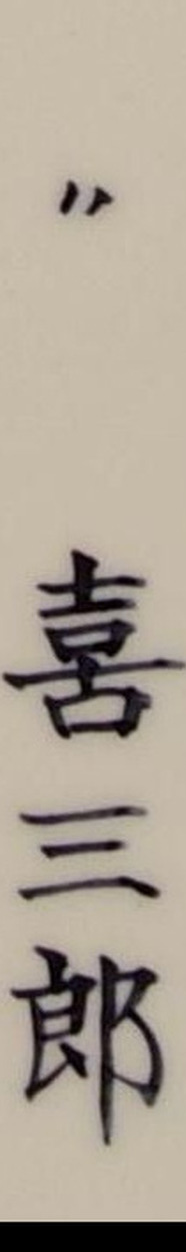喜三郎
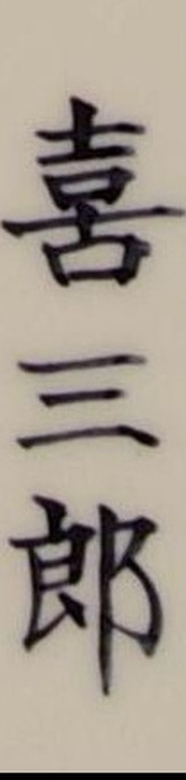喜三郎
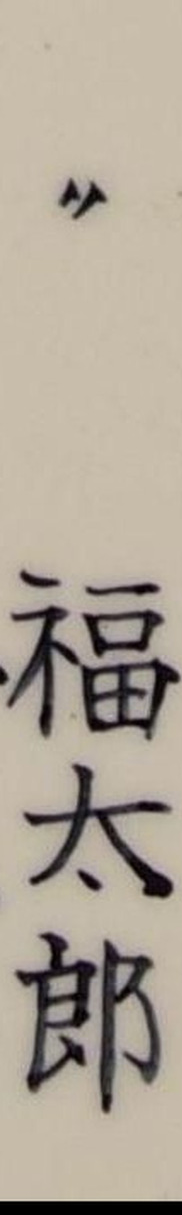福太郎
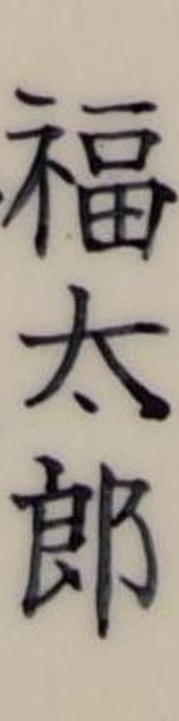福太郎
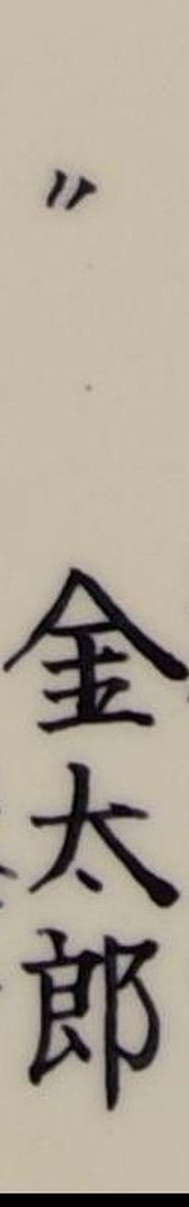金太郎
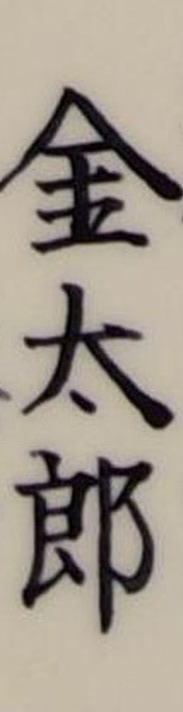金太郎
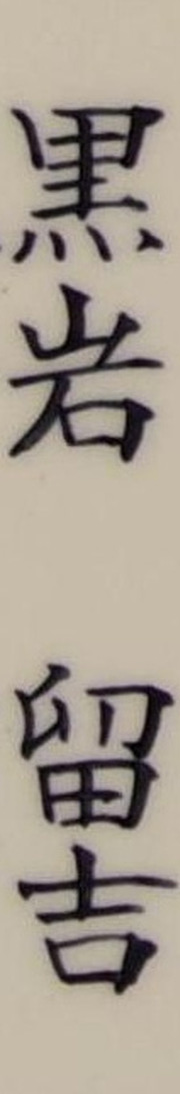黒岩留吉
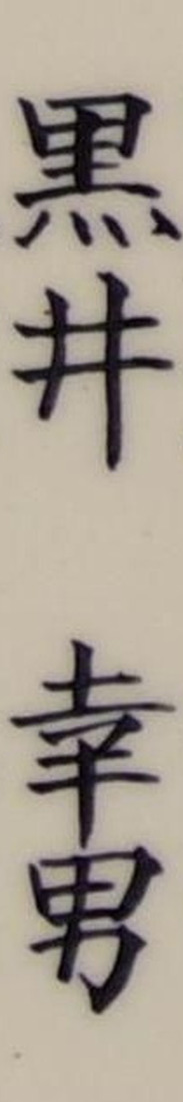黒井幸男
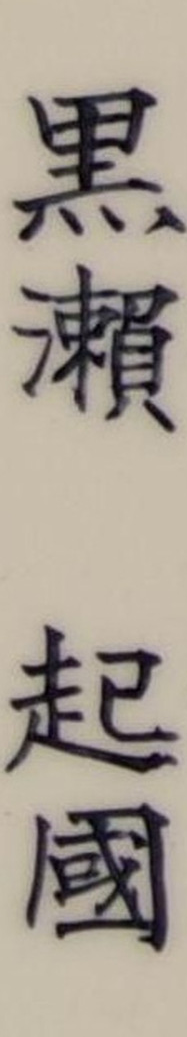黒瀬起國
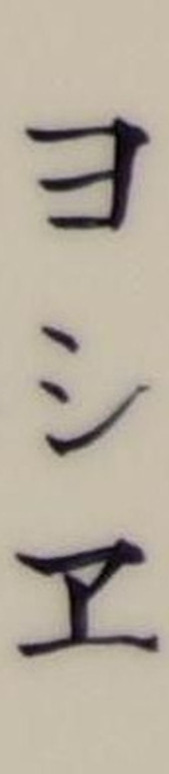ヨシエ

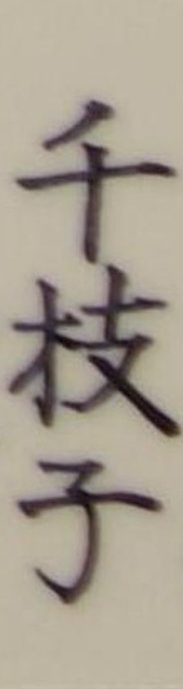千枝子
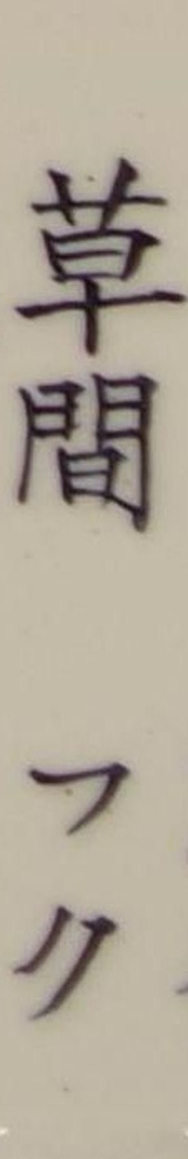草間フク
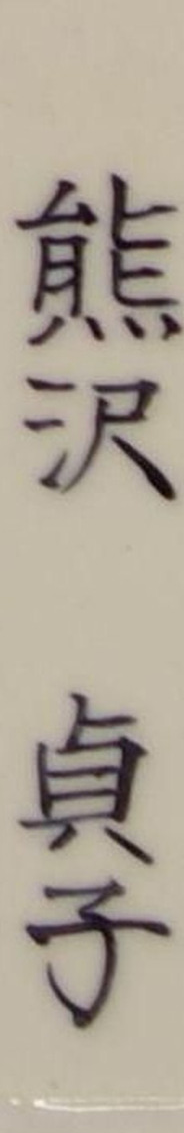熊沢貞子
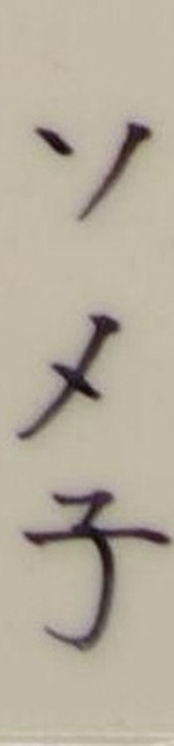ソメ子
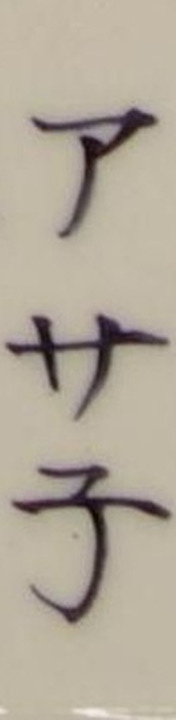アサ子
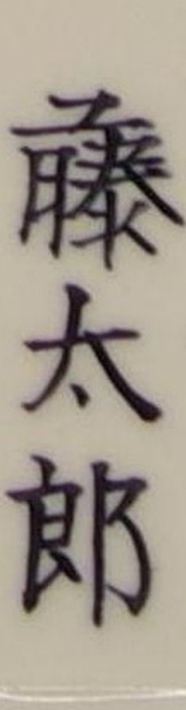藤太郎
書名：E~L
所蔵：高野山金剛峯寺
